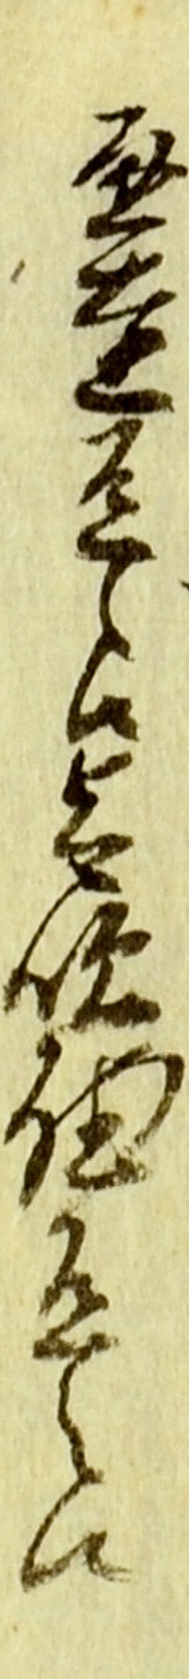通達有之候旨吹聴有之候
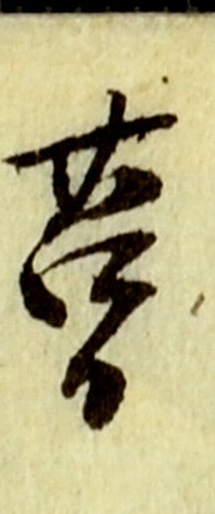廿四日
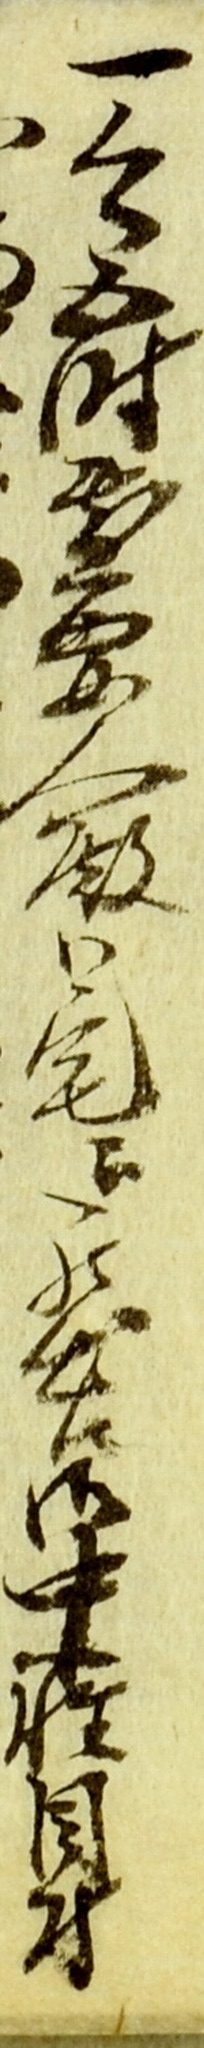一今五時前要人殿御宅江罷出候御中小性目付
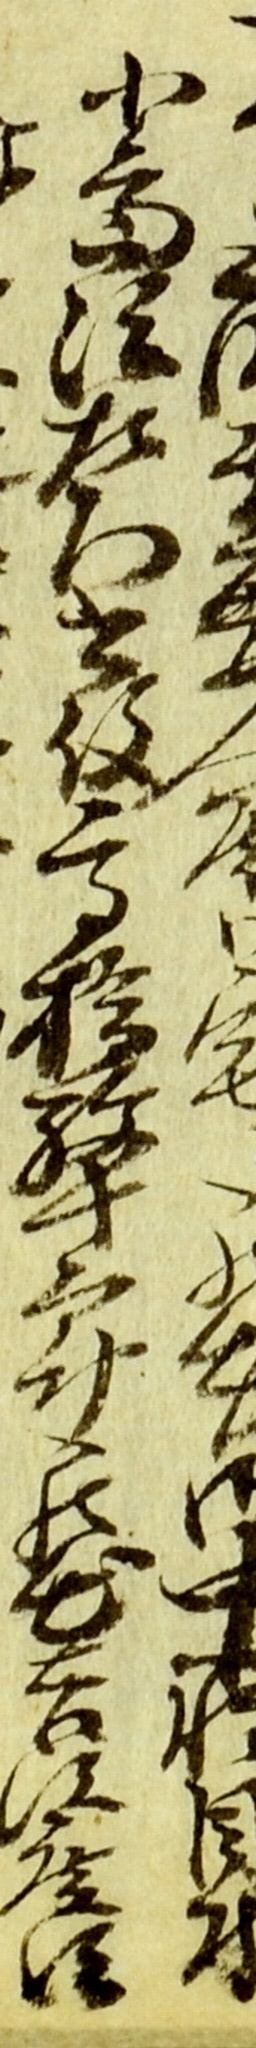小島治左衛門出役高橋敬十郎罷出吉沢廣治
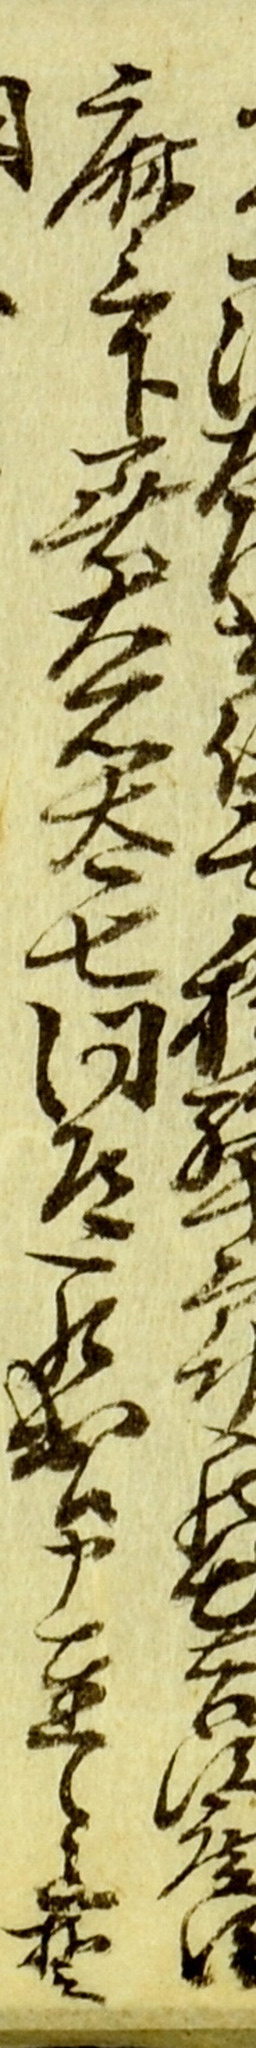麻上下着大石太七同道罷出候申達之上誓
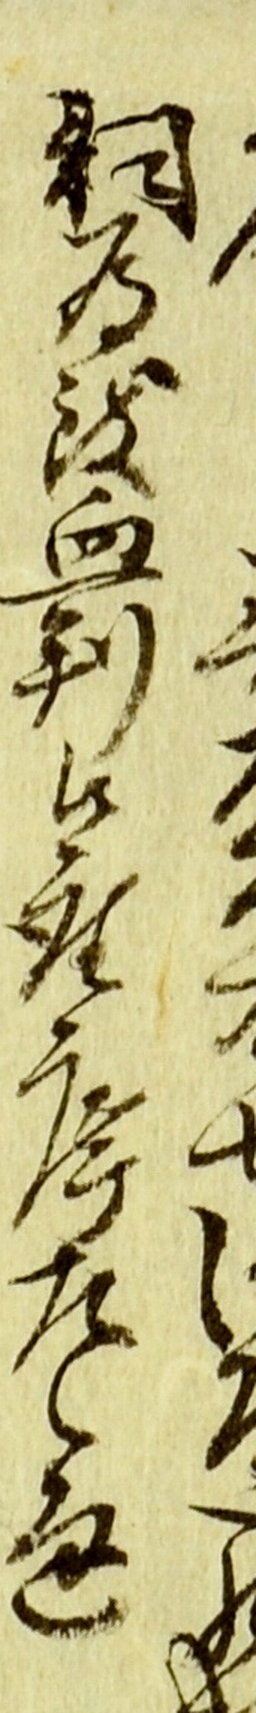詞為致血判候座席左之通
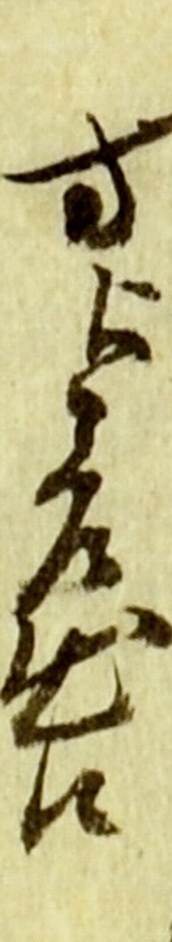方江差出候
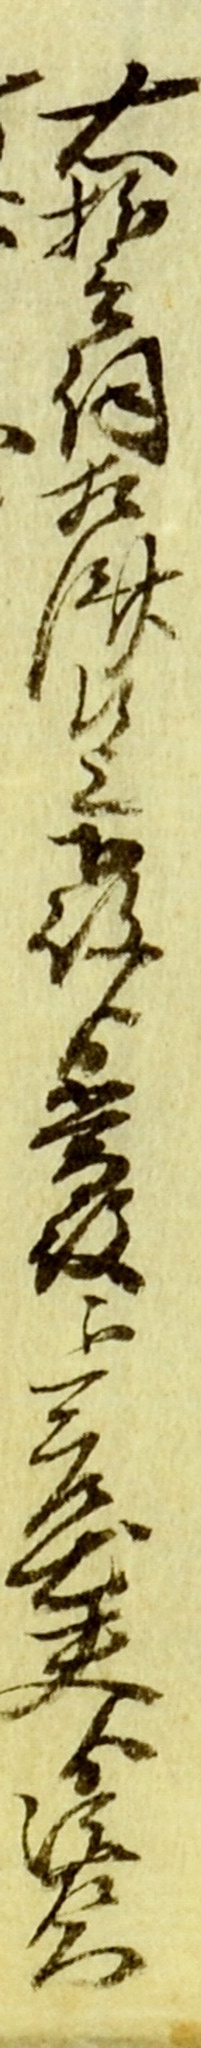右誓詞相済候上下役ゟ当役江善太夫ゟ治左衛門
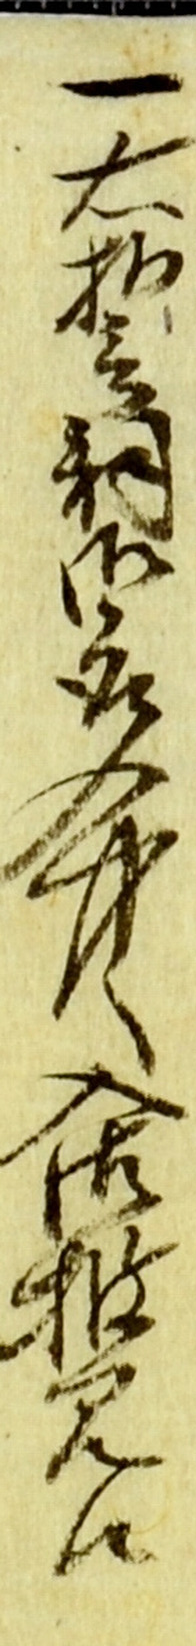一右誓詞御取入中へ入御披見候
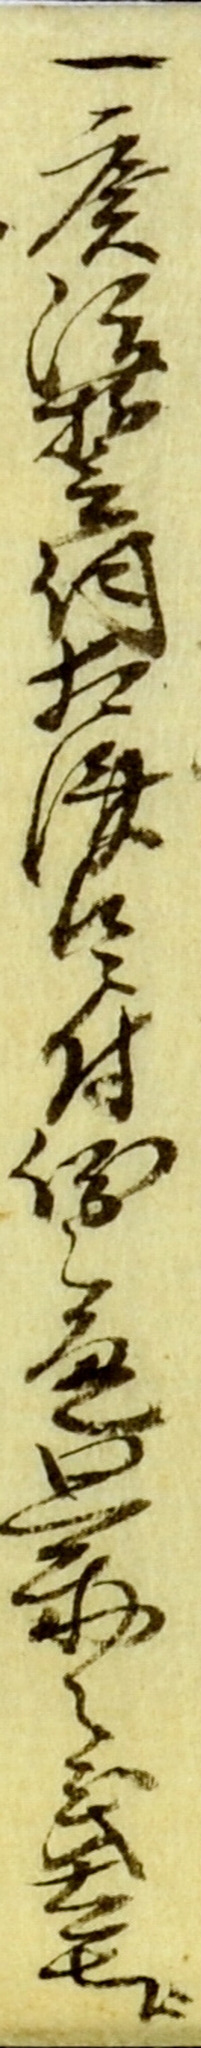一廣治誓詞相済候ニ付例之通廻勤之義太七江
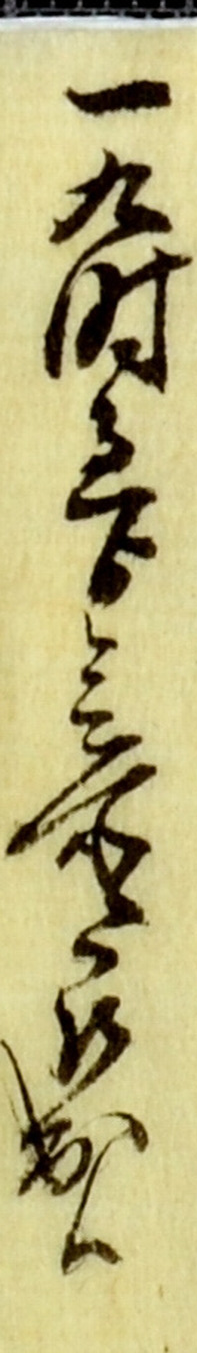一九時過ゟ会所ニ罷出候

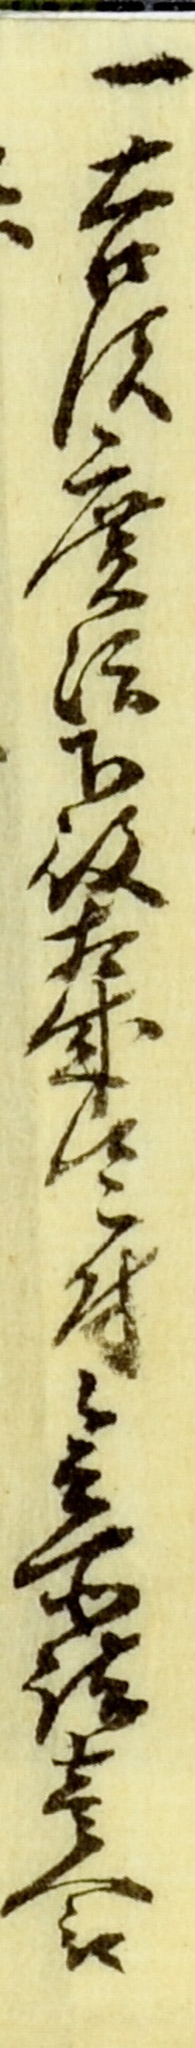一吉沢廣治下役相成候ニ付会所詰壱人江
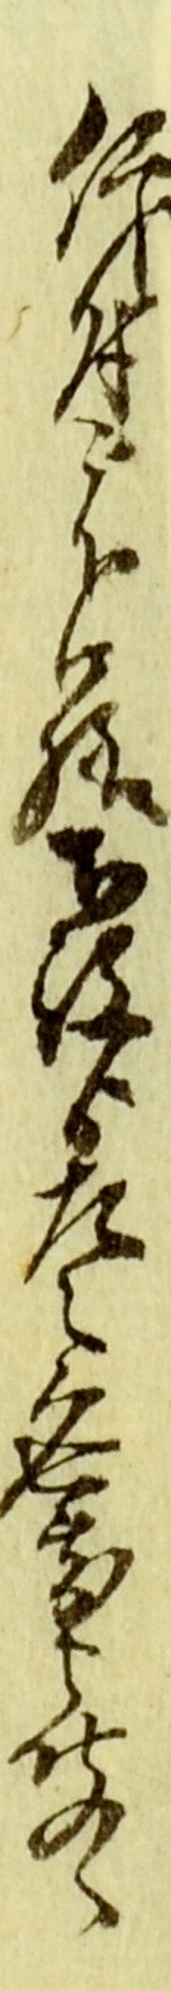仰付被下候様下役ゟ左之名前申聞候
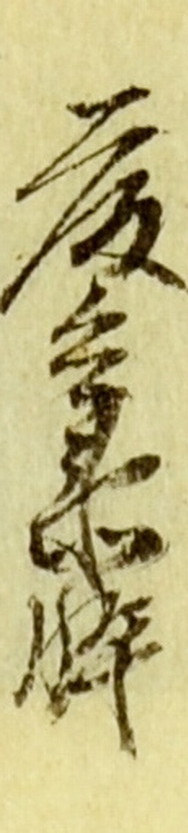藤兵衛倅
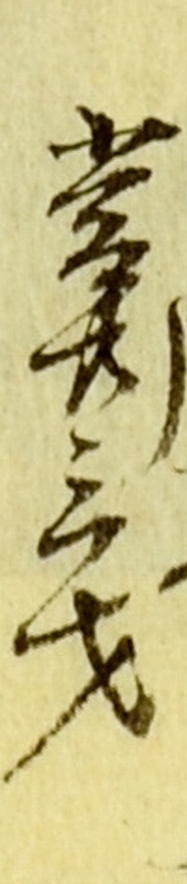当廿三才
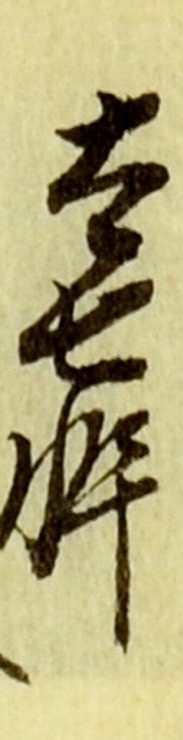太七倅
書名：諸事御用留
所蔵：伊那市立高遠町図書館・合同会社AMANE
